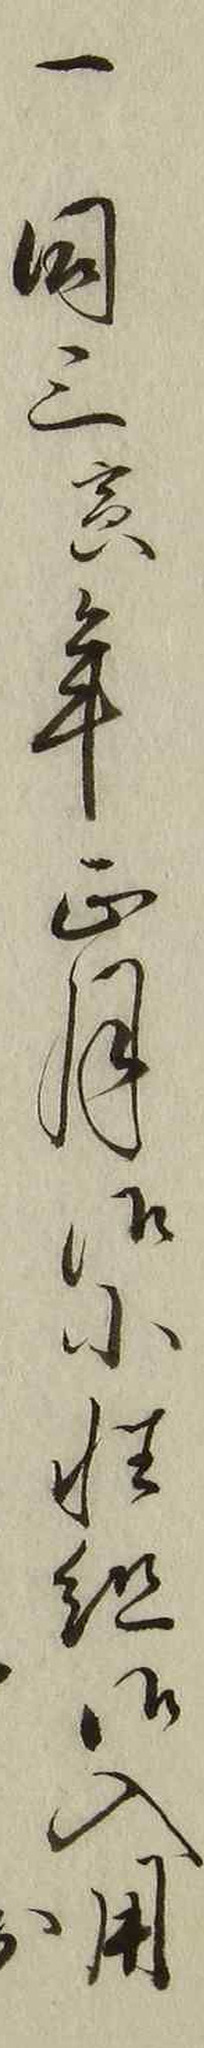一同三寅年正月御小性組御入用
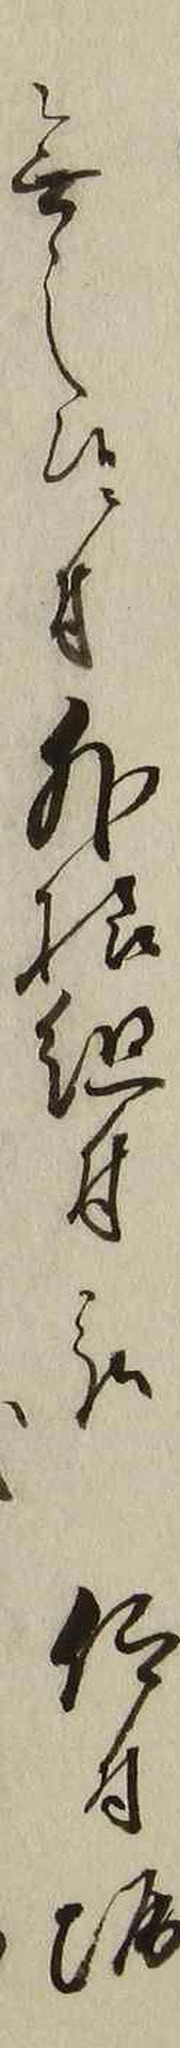無之候ニ付外様組付被仰付堀
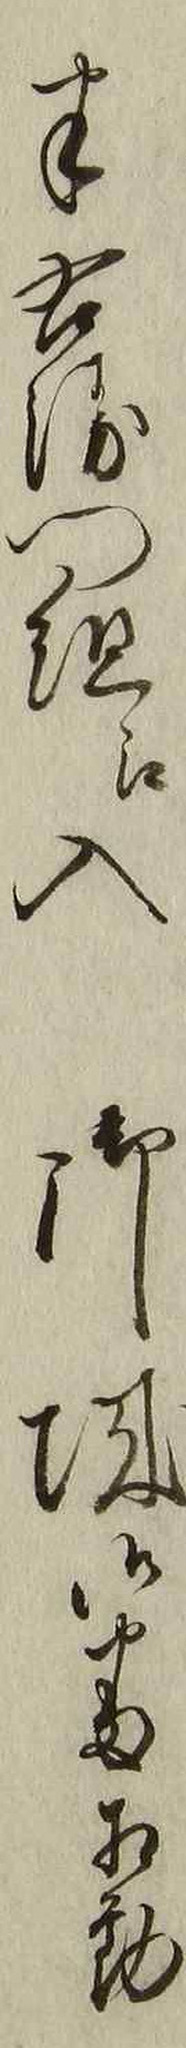半右衛門組江入御城御番相勤
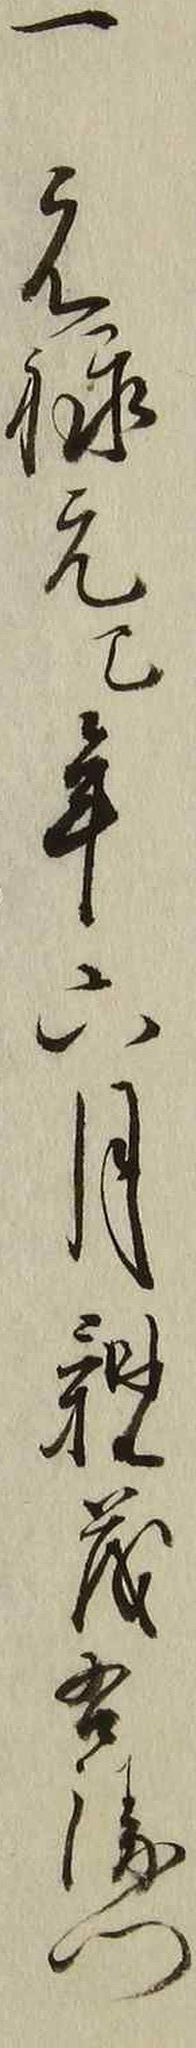一元禄元巳年六月親茂右衛門
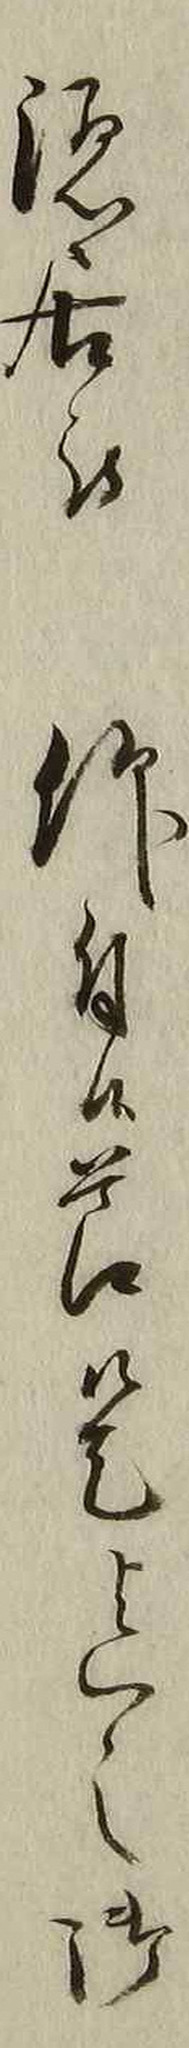隠居被仰付候節是迄之御
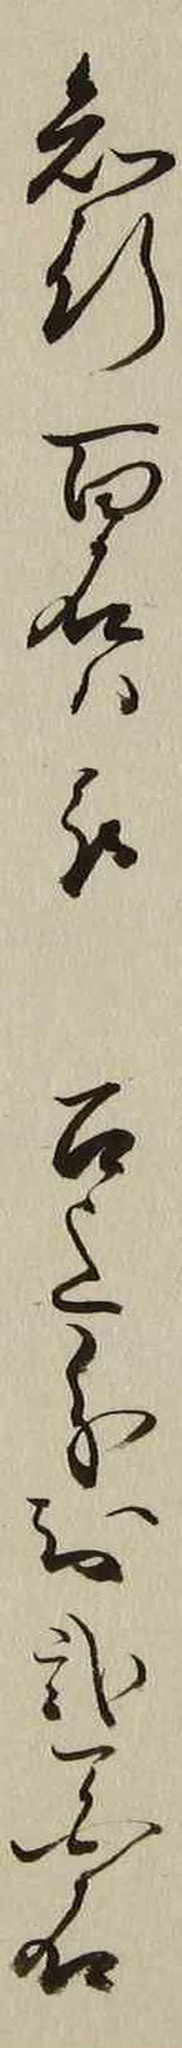知行百石ハ被召上分知弐百石
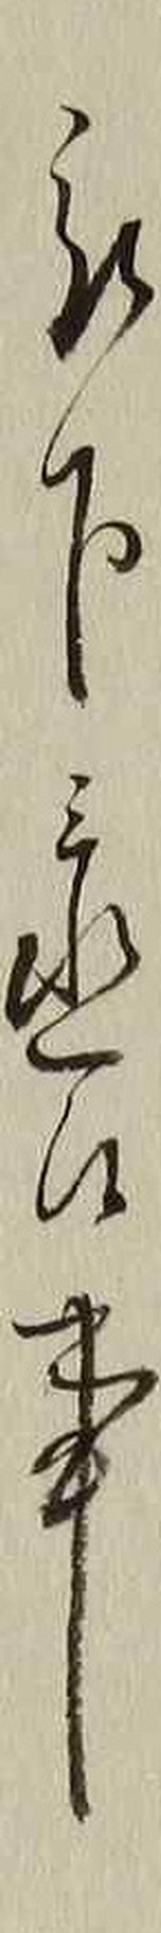被下置候事
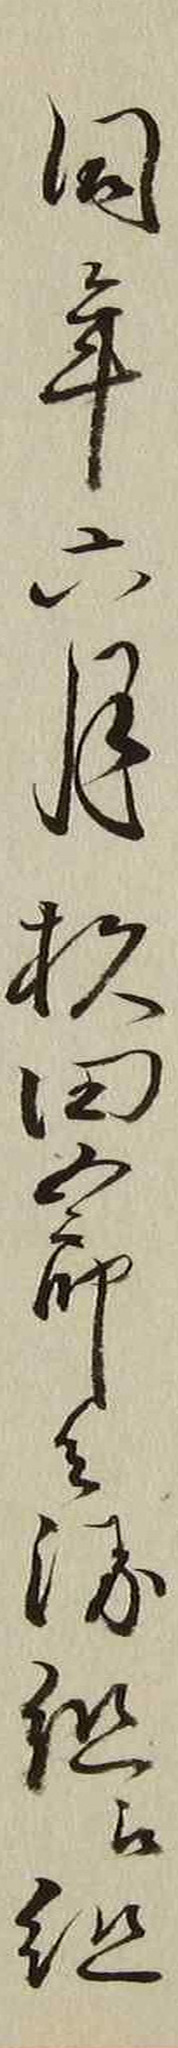一同年六月杉田五郎兵衛組江組
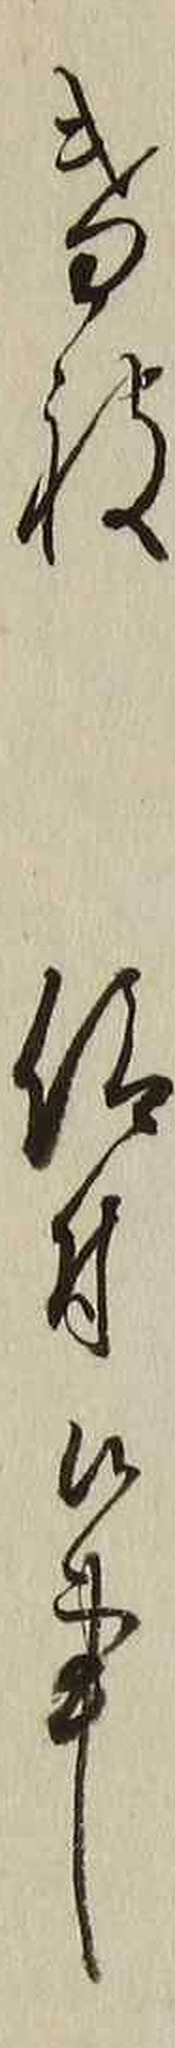替被仰付候事
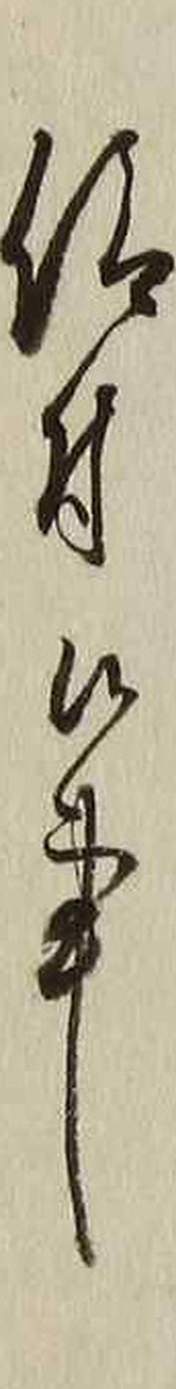仰付候事
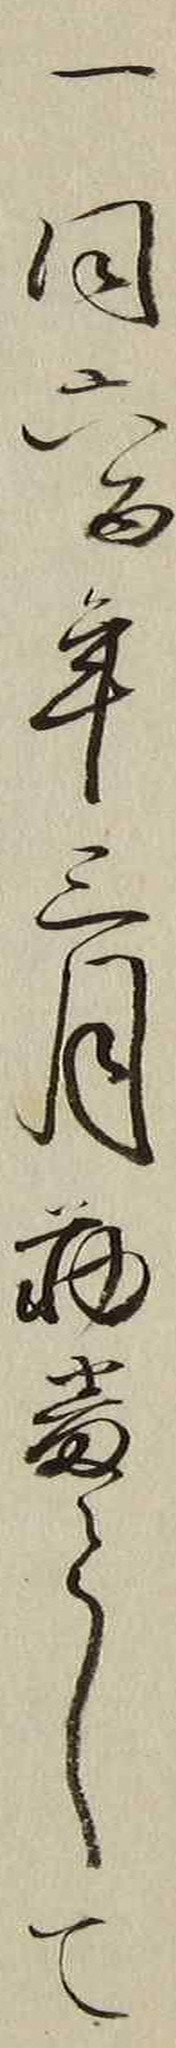一同六酉年三月勤番として
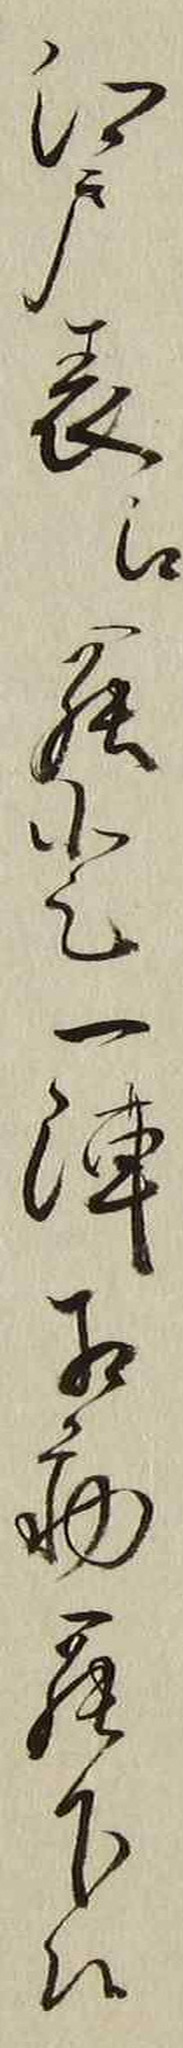江戸表江罷登一陣相勤罷下候
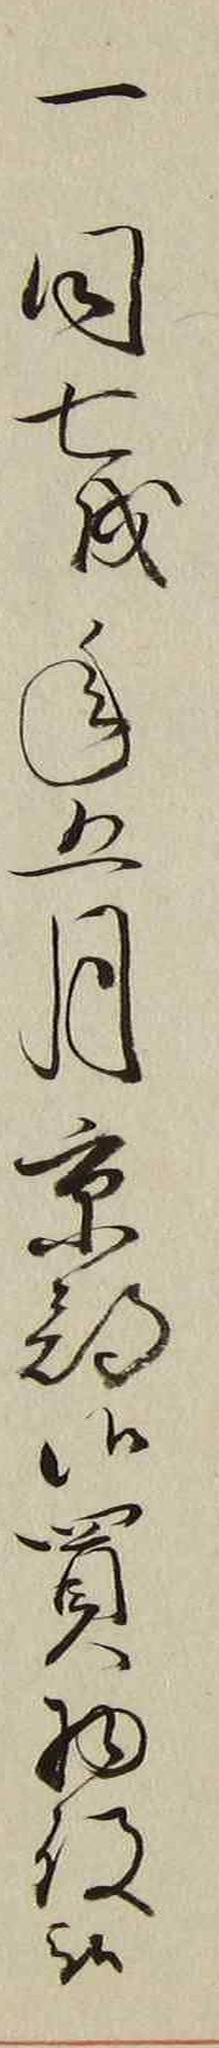一同七戌年五月京都御買物役被
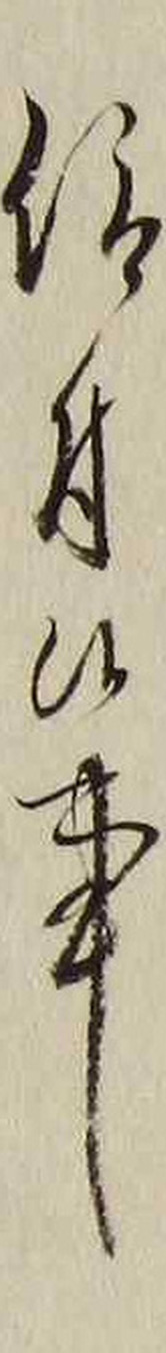仰付候事
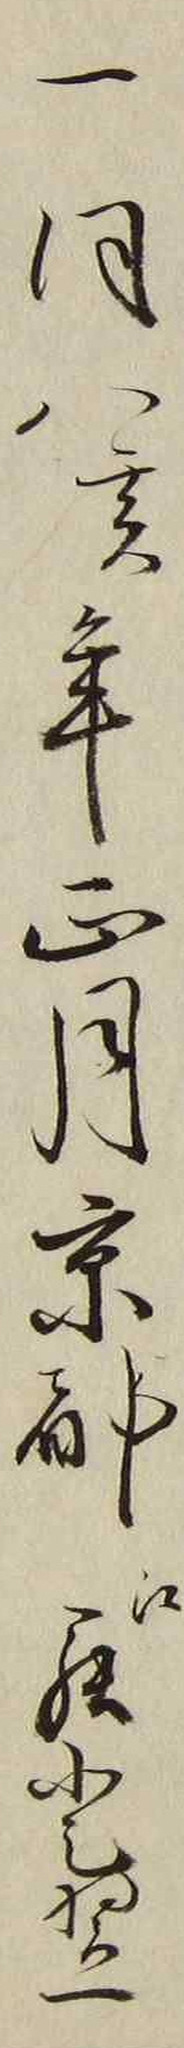一同八亥年正月京都江罷登翌

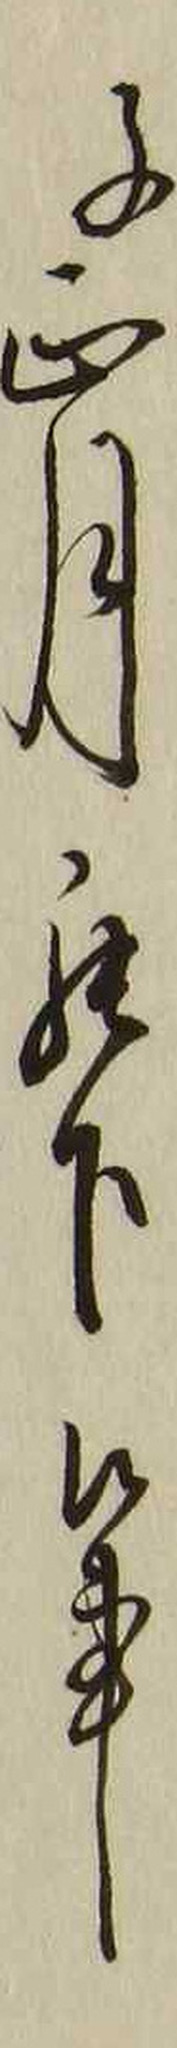子正月罷下候事
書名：諸士系譜　巻之2　い之部2
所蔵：会津若松市立会津図書館
